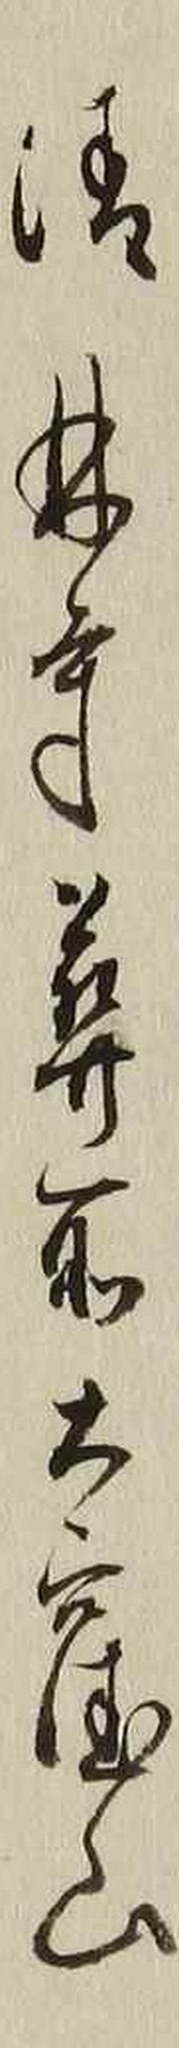清林寺葬所大窪山
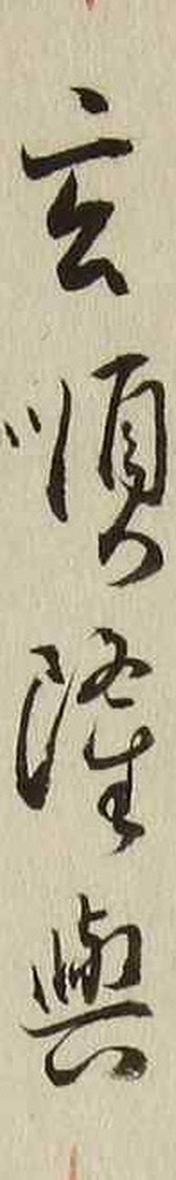玄順隆與
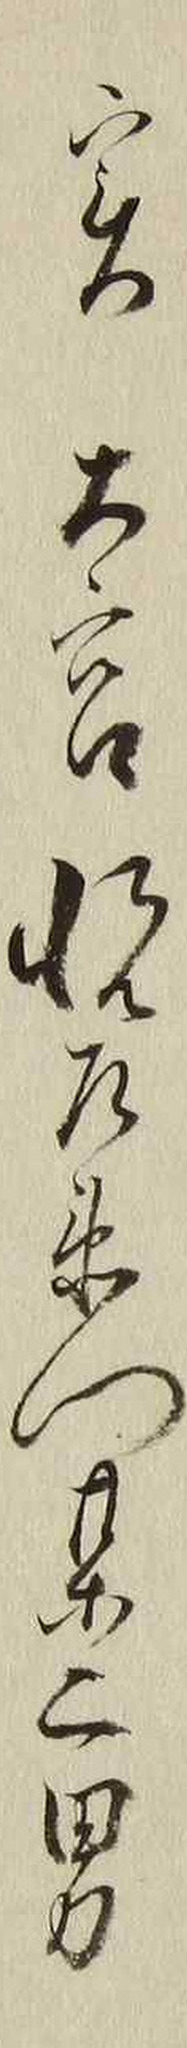実大宮悦左衛門某二男
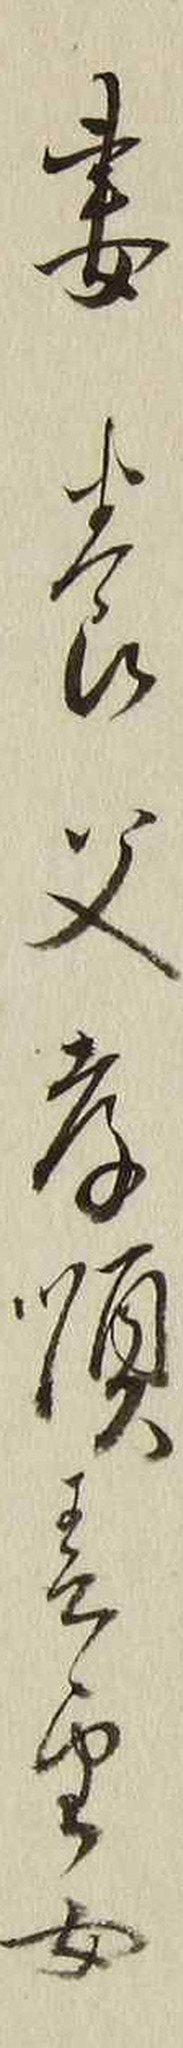妻養父孝順春望女
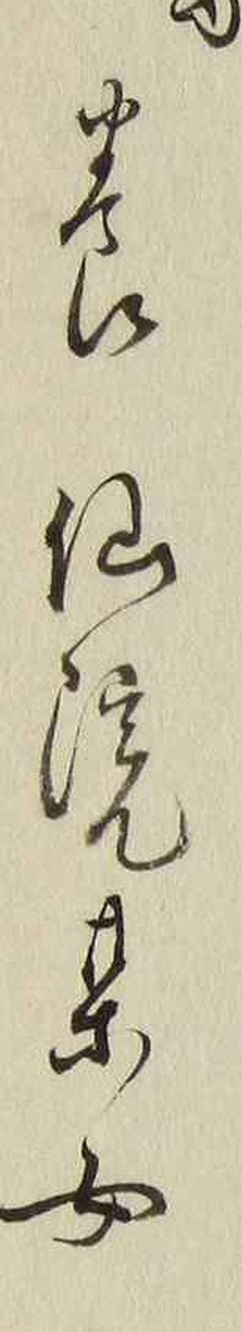養仙院某女
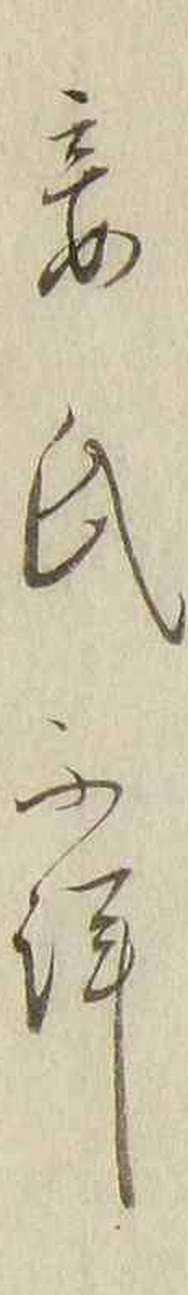妾氏不詳

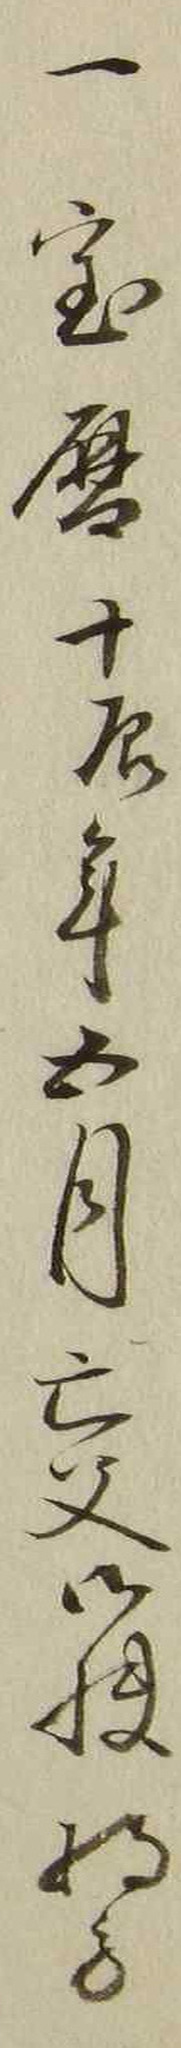一宝暦十辰年五月亡父御扶持方
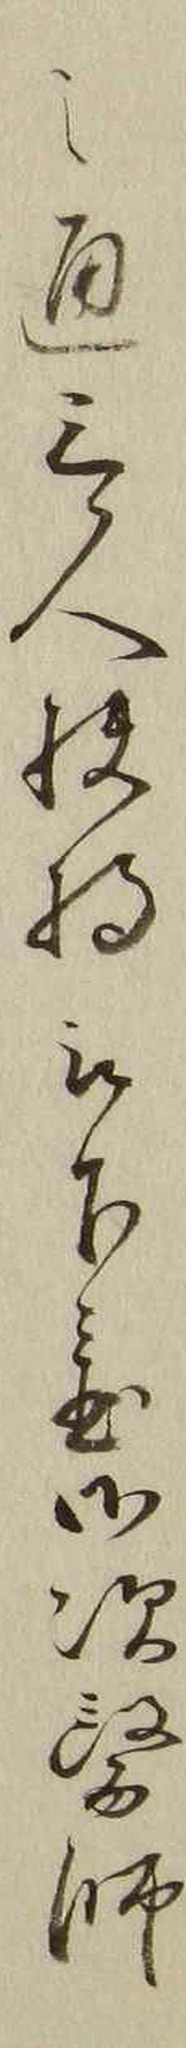之通三人扶持被下置御次医師
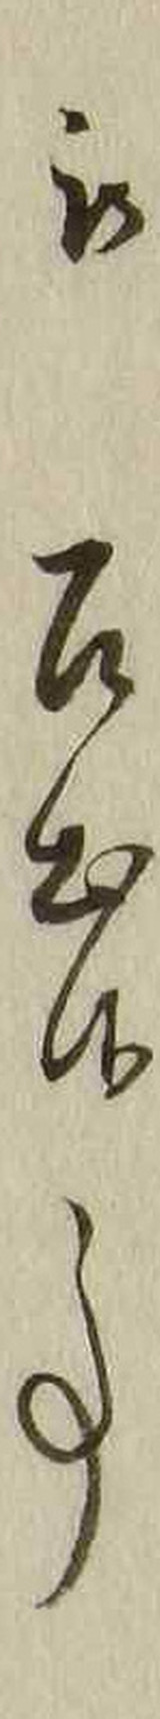被召出候事
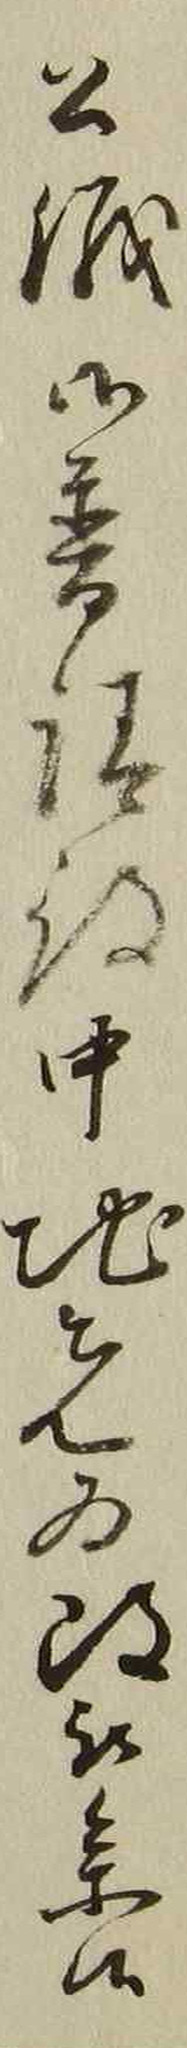公儀御普請役中地先為改被参候
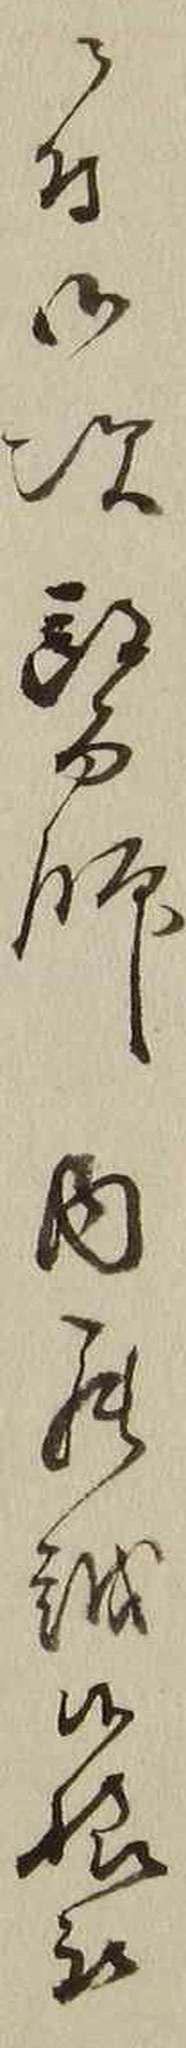ニ付御次医師内罷越候様被
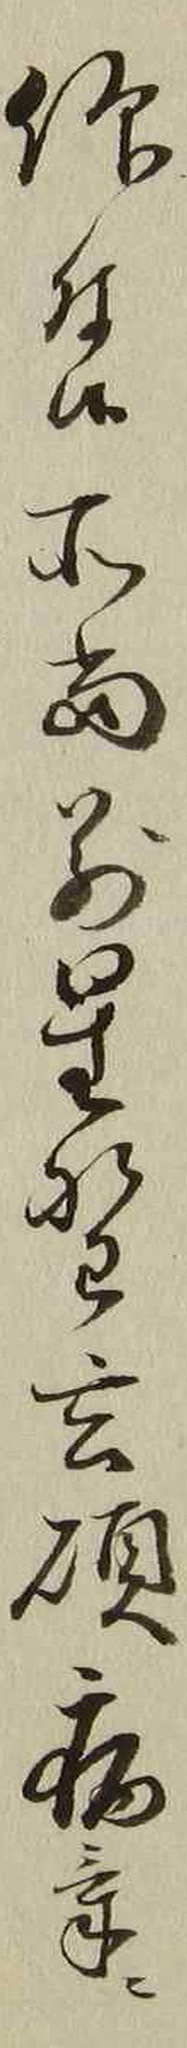仰付候所当別星野玄硯病気ニ
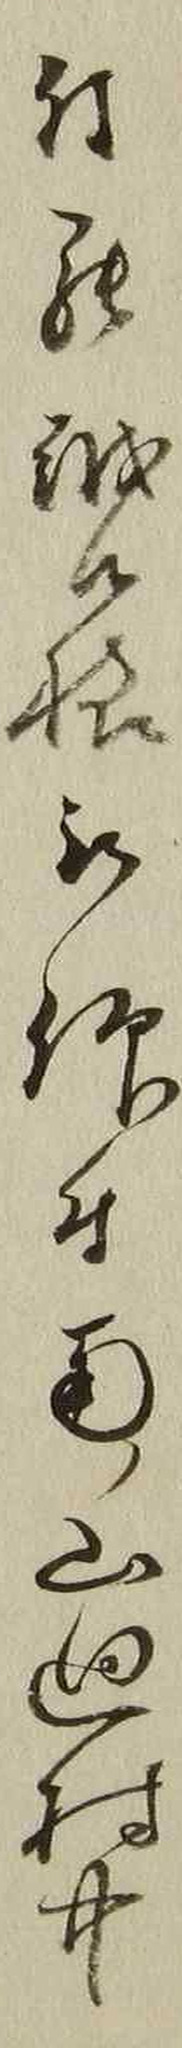付罷越候様被仰付南ノ山廻村中
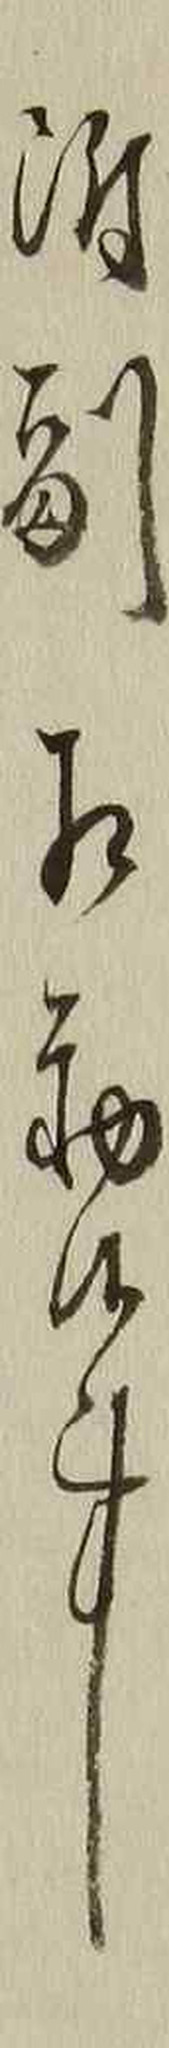附副相勤候事
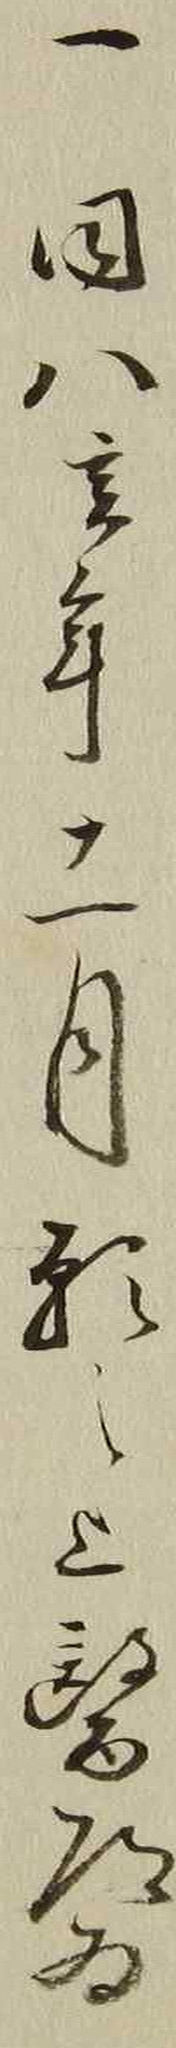一同八亥年二月願之上医道為
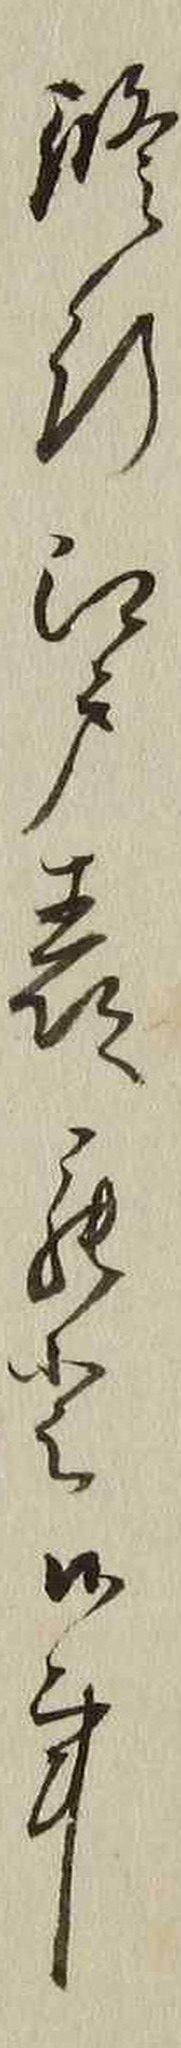修行江戸表へ罷登候事
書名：諸士系譜　巻之129　た之部5
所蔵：会津若松市立会津図書館
